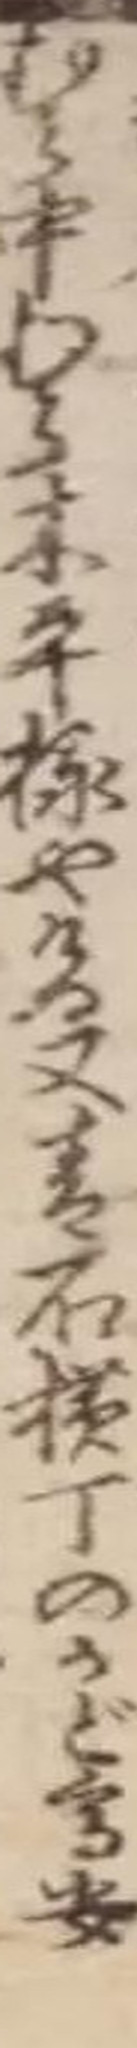むら中むら木平さまやける又青石横丁のかど高安
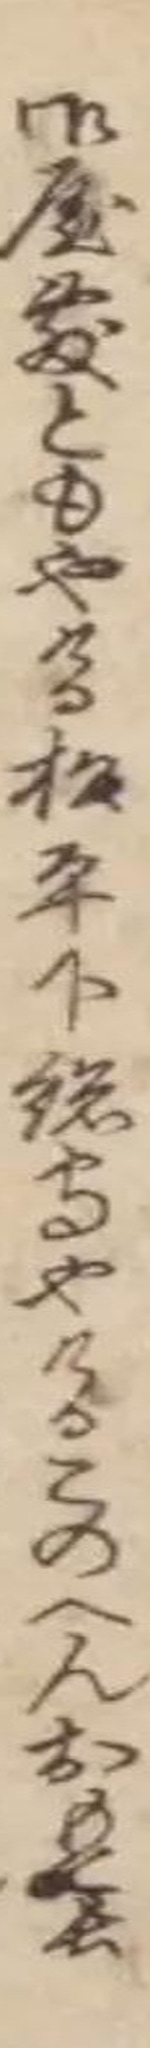御屋敷ともやける松平下総守やけるこのへんおもて長
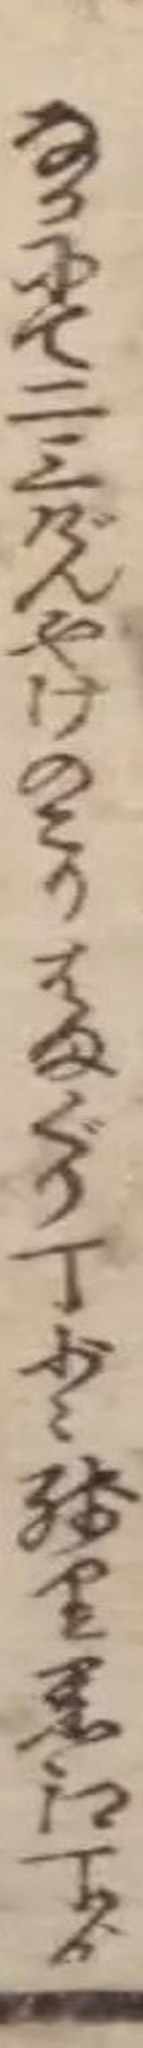なかにて二三げんやけのこりはまぐり丁少々残り黒江丁ゟ
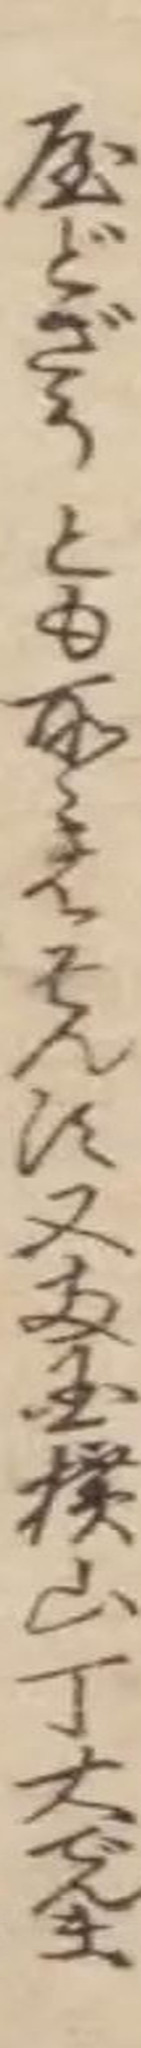屋どざうとも所々はそんす又友国横山丁大でん附ま
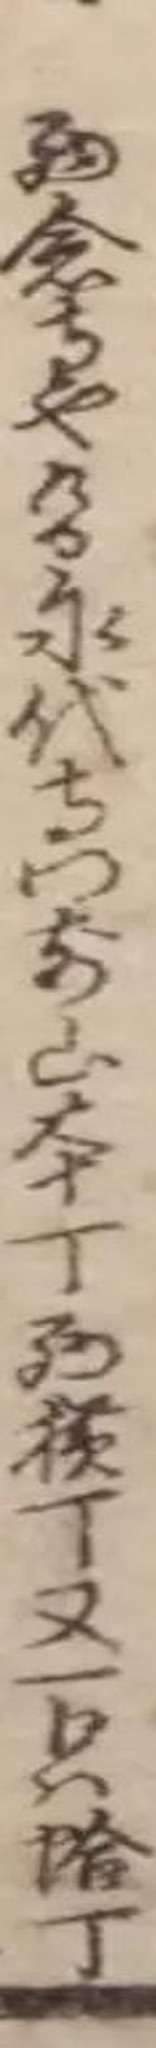西念寺やける永代寺門前山本丁西横丁又一口は蛤丁
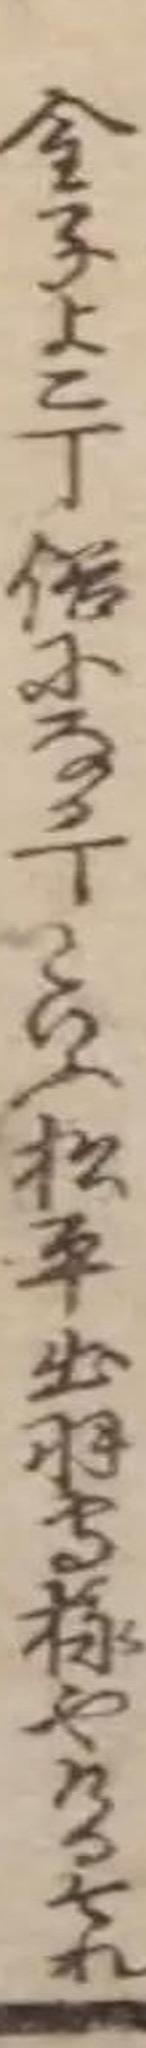金子よこ丁になか丁といふ松平出羽守様やけるそれ
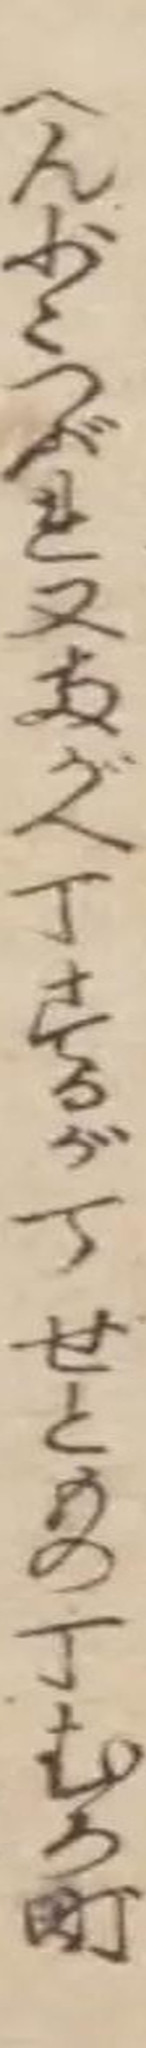へん少々つぶれ又両がへ丁するが丁せともの丁むろ町
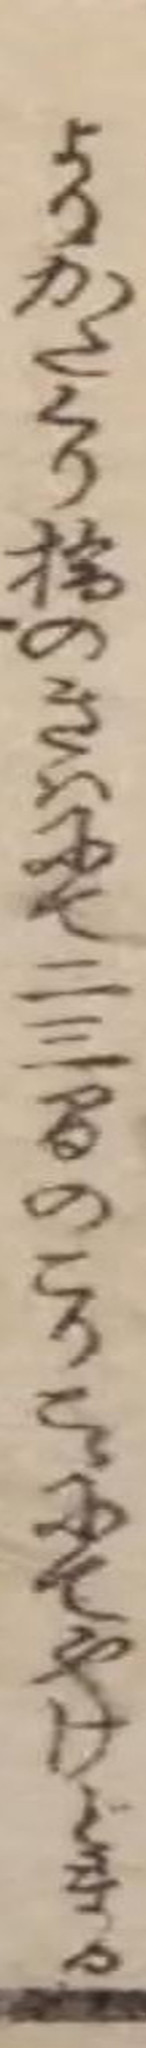よりかたくり橋のきはにて二三間のこりこゝにてやけどまる
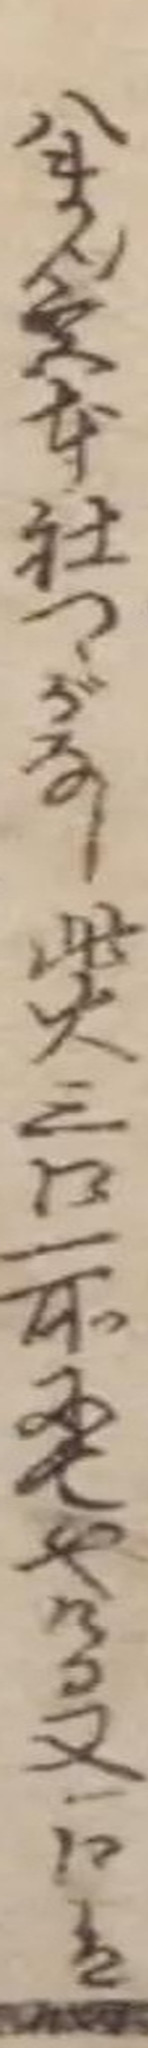八まん宮本社つゝがなし此火三口一所にてやける又一口は
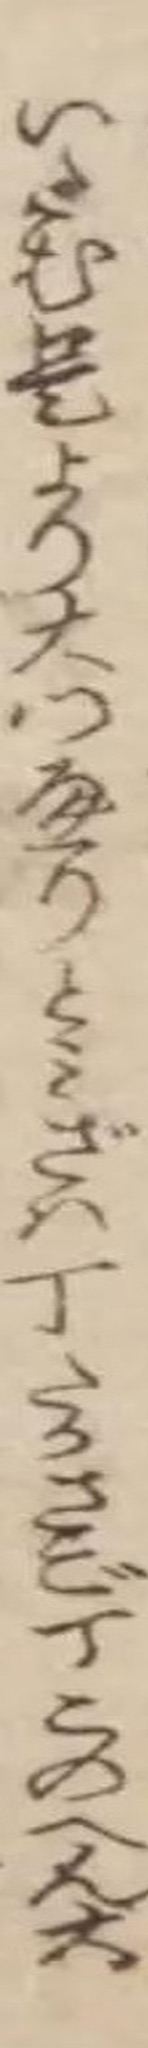いたむ是より大門通りとみざは丁町たかさご丁このへん大
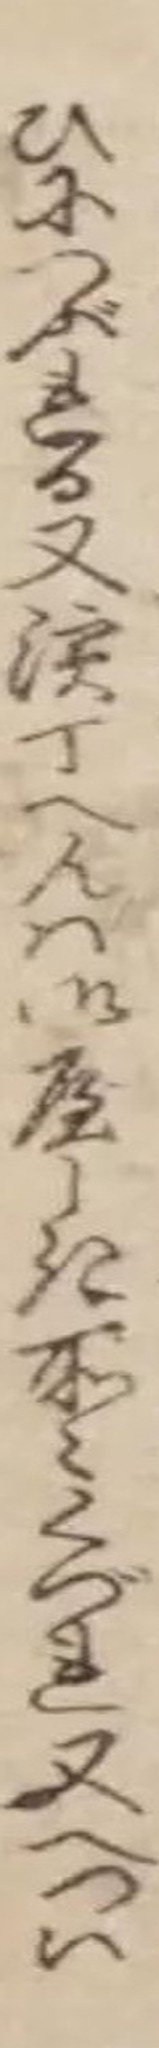ひにつぶれる又濱丁へんは御屋しき所〃くづれ又へつい
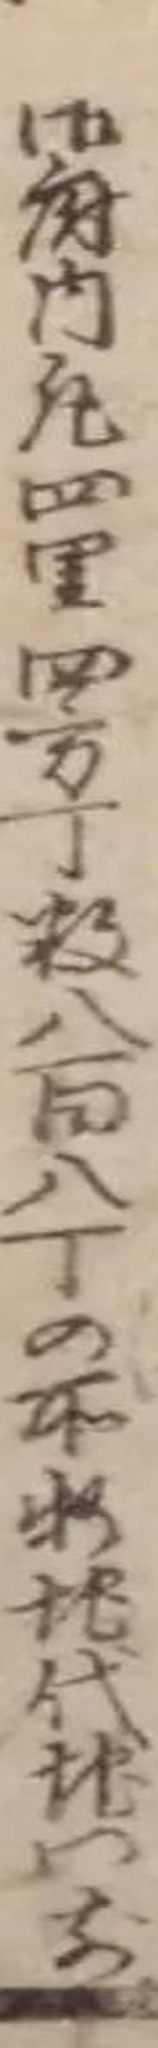御府内凡四里四方丁数八百八丁の所新地代地門前
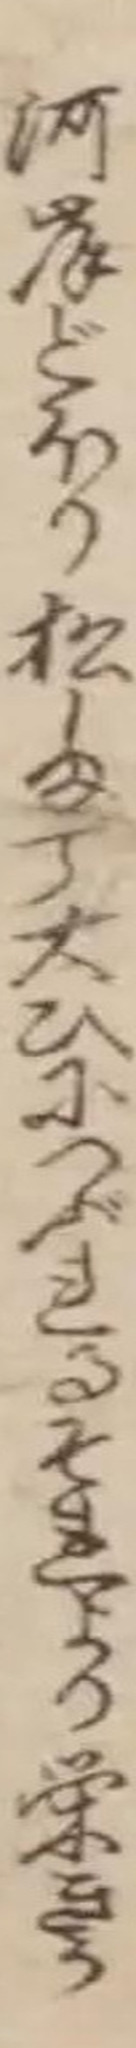河岸どほり松しま丁大ひにつぶれるそれより栄きう
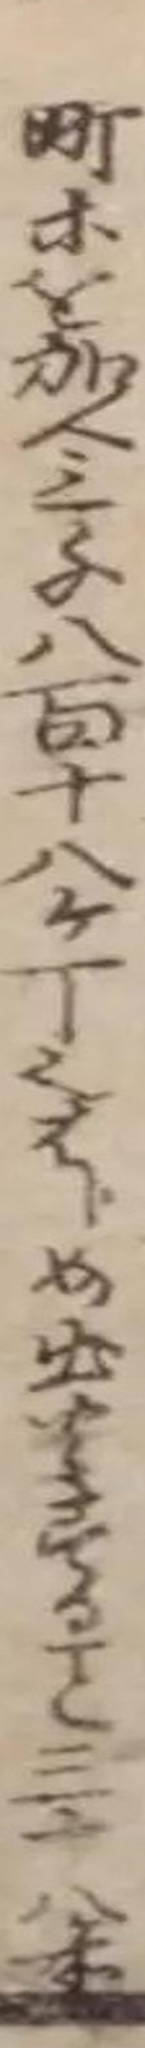町等を加へ三千八百十八ヶ丁也はじめ出火すること三十八ヶ所
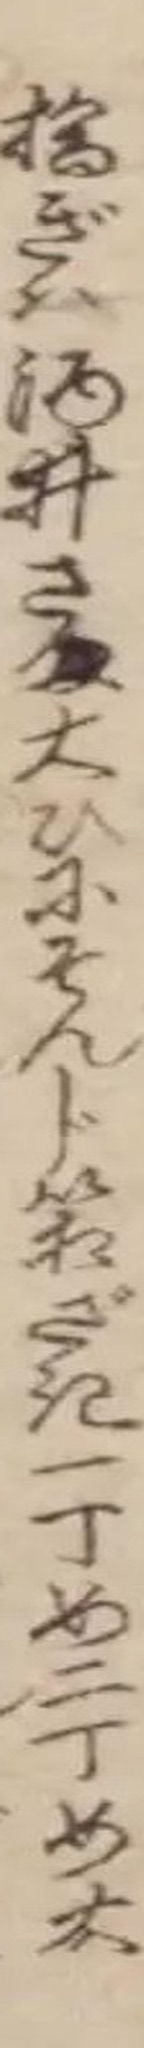橋ぎは酒井さま大ひにそんじ箱ざき一丁め二丁め大
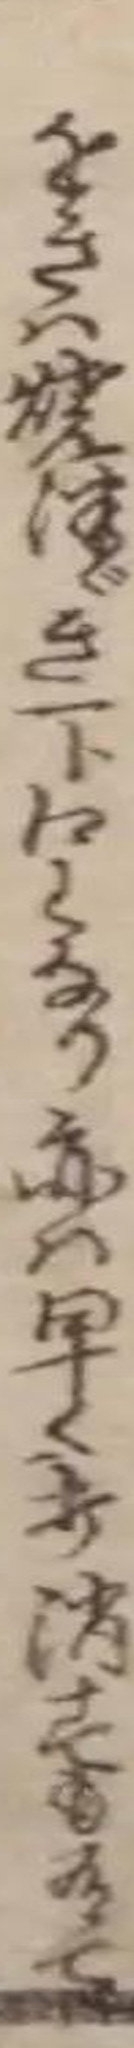近きは焼つゞき一ト口となり亦は早く打消すも有て
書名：関東大地震末代鑑
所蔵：国立国会図書館 National Diet Library, JAPAN
